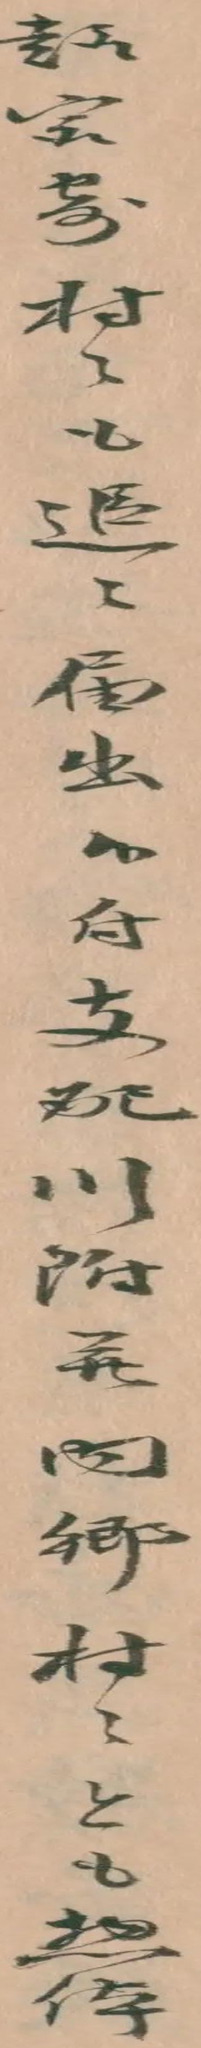趣最寄村々も追々届出候付支配川附并内郷村々とも惣体
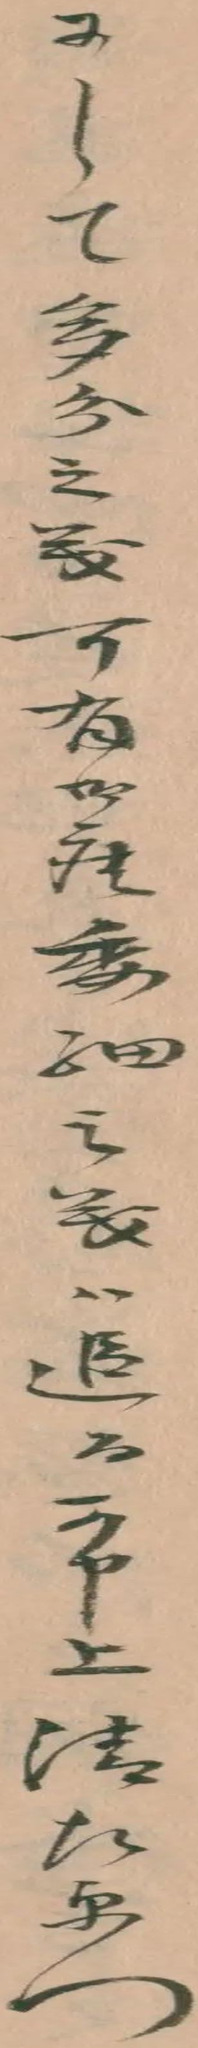にして多分之義可有御座候委細之義ハ追而可申上清左衛門
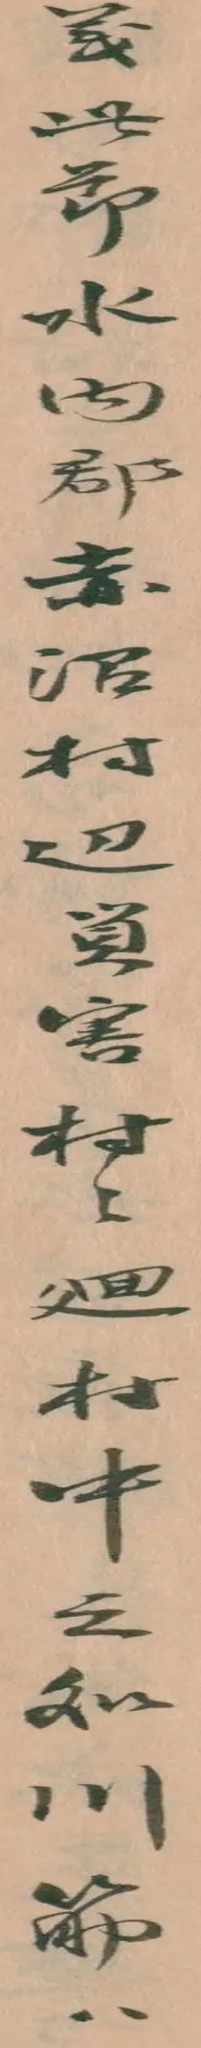義此節水内郡赤沼村辺災害村々廻村中之処川筋ハ
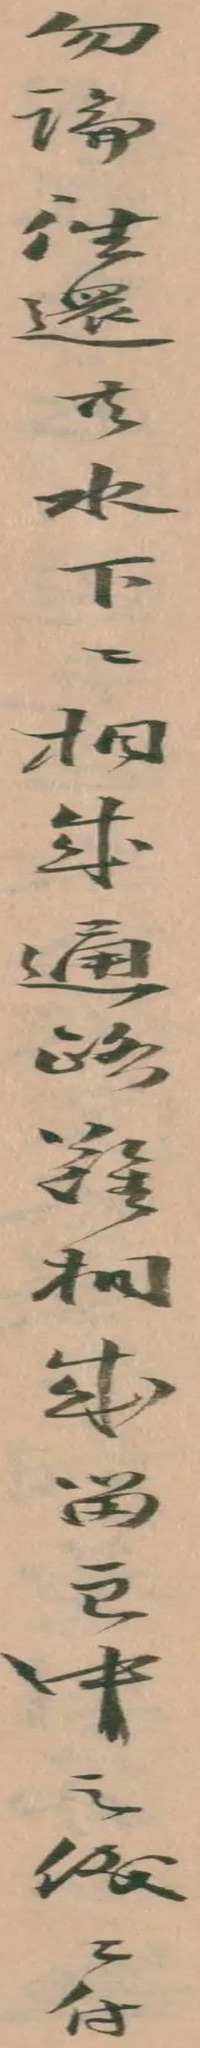勿論往還共水下二相成通路難相成留主中之儀二付
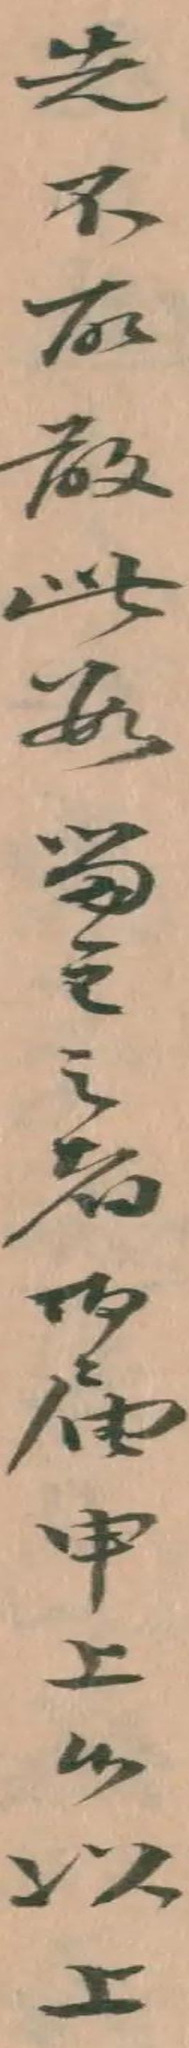先不取敢此段留主之者御届申上候以上
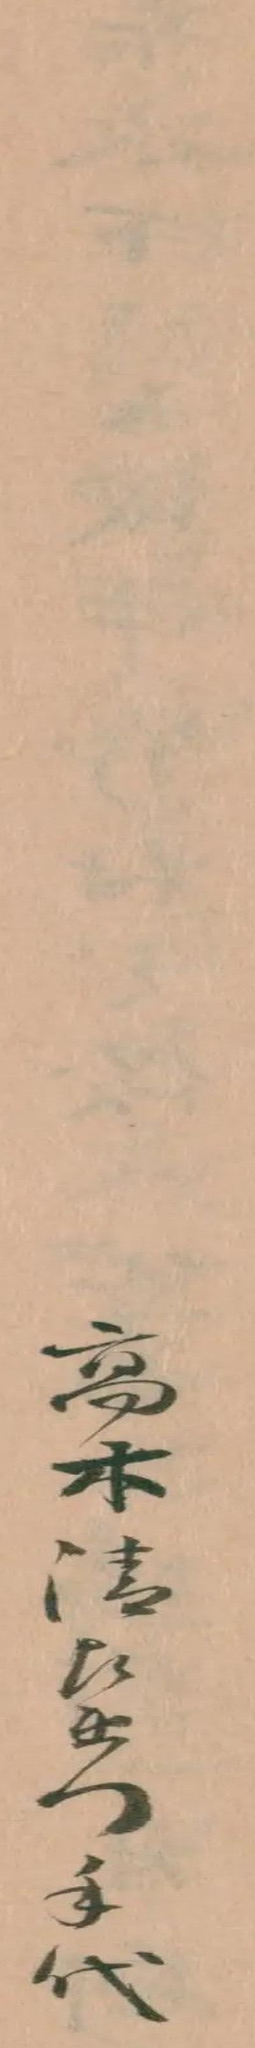高木清左衛門手代
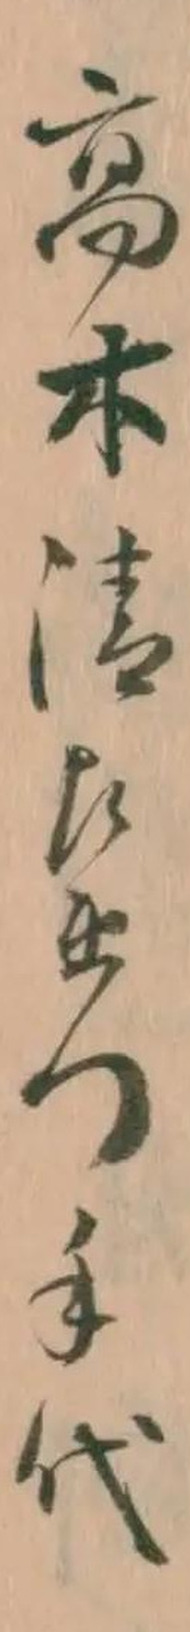高木清左衛門手代
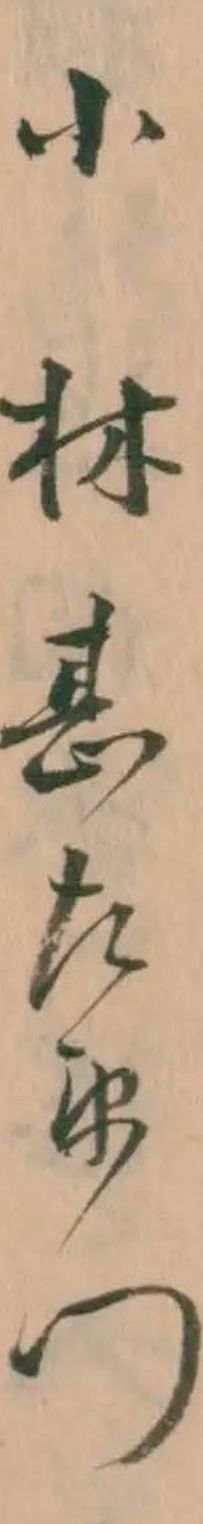小林甚左衛門
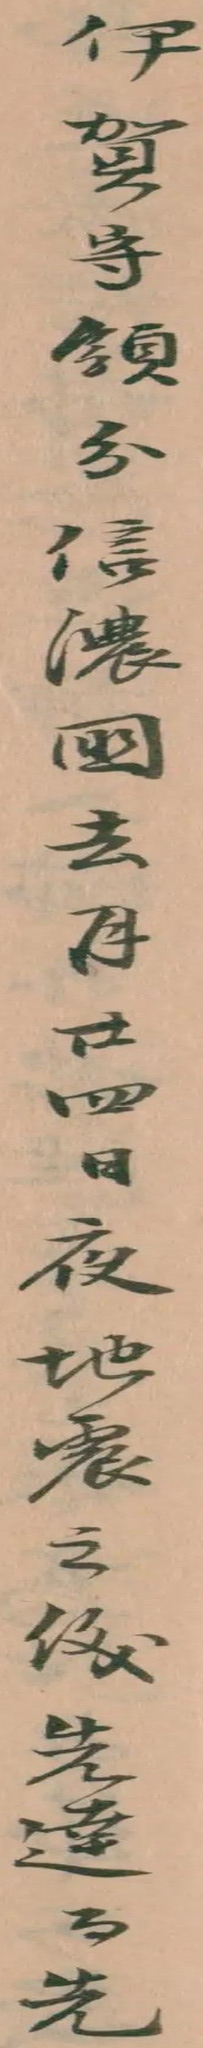伊賀守領分信濃国去月廿四日夜地震之儀先達而先
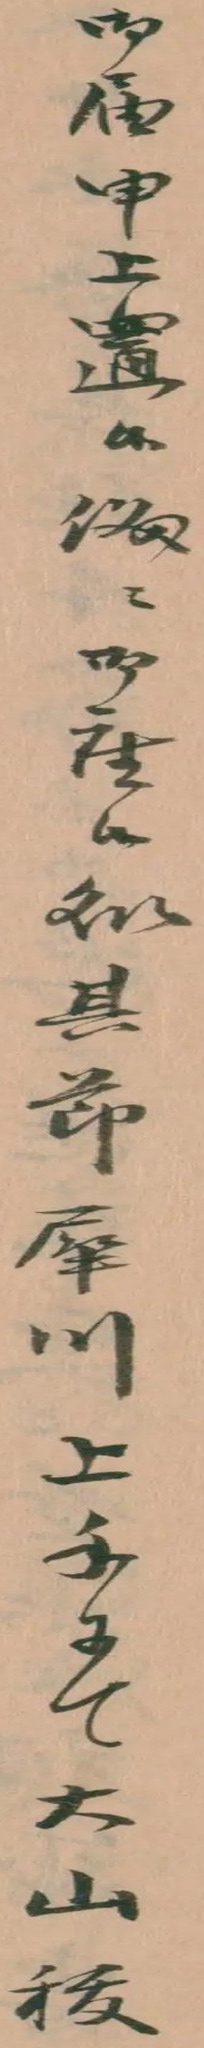御届申上置候儀二御座候処其節犀川上手にて大大山抜
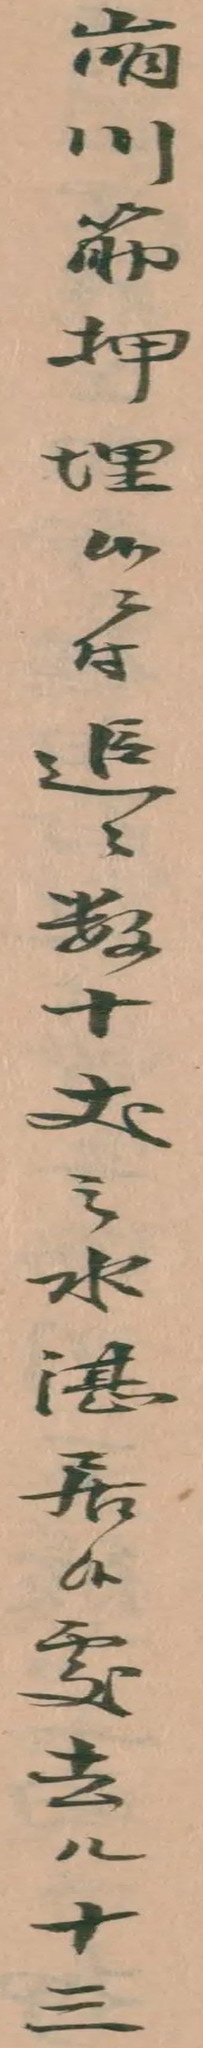崩川筋押埋候二付追々数十丈之水湛居候処去十三
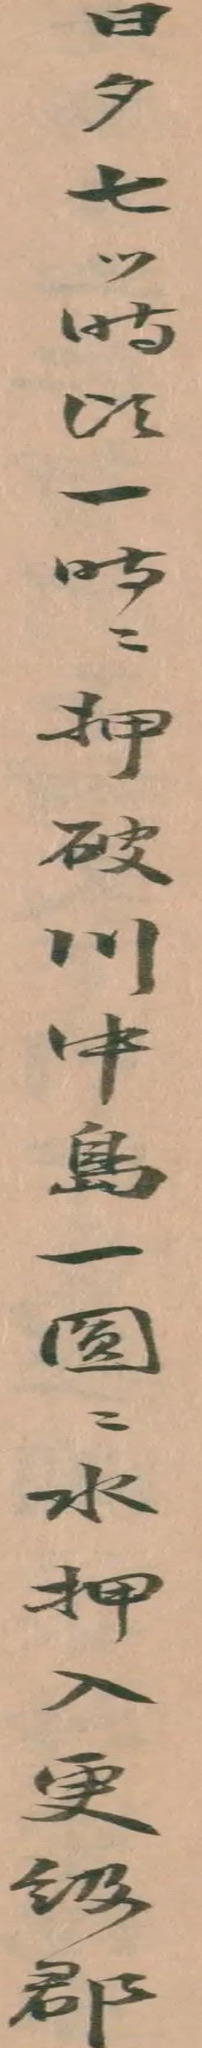日夕七ッ時頃一時二押破川中嶋一円二水押入更科郡
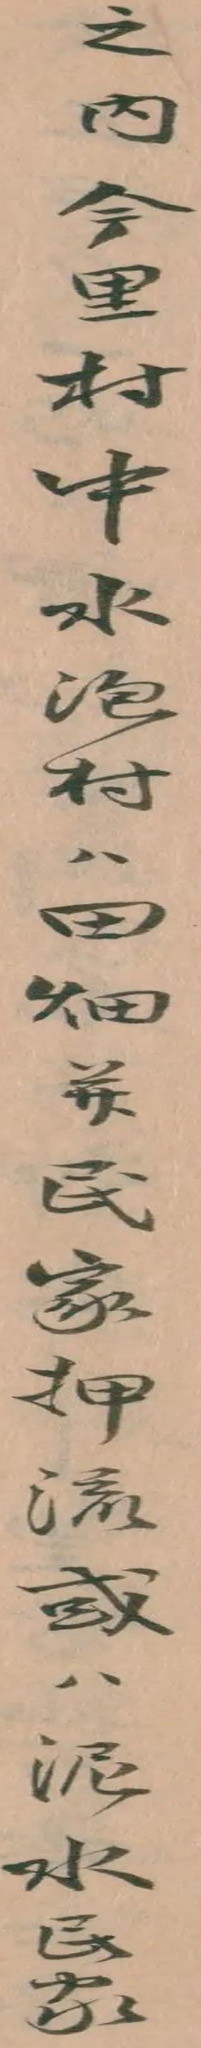之内今里村中氷鉋村ハ田畑并民家押流或ハ泥水民家
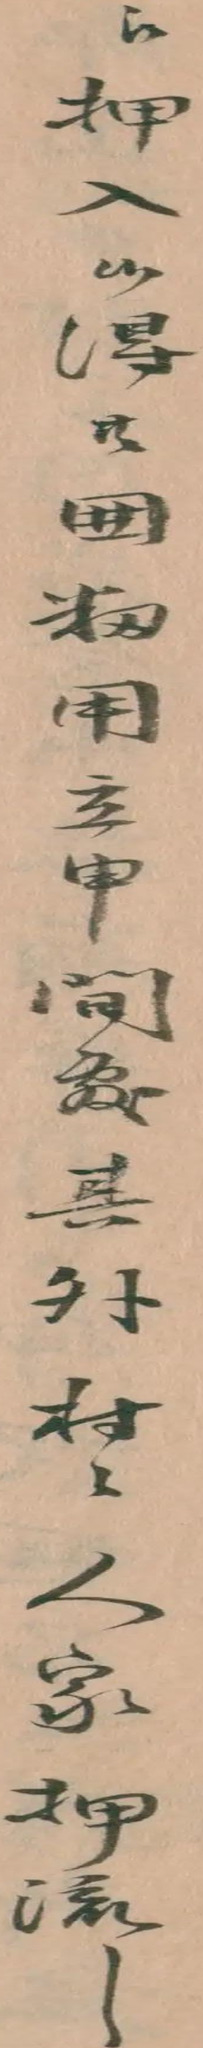江押入候得共囲籾用立申間敷其外村々人家押流し
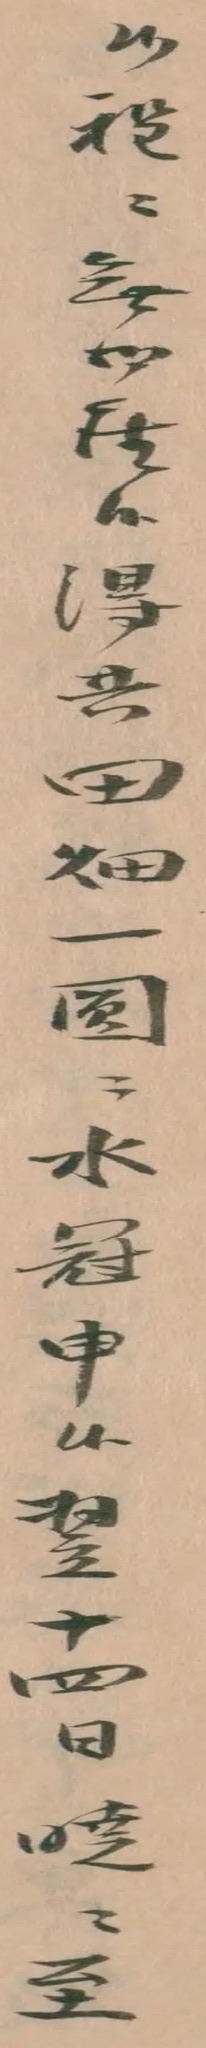候程二無御座候得共田畑一円二水冠申候翌十四日暁二至
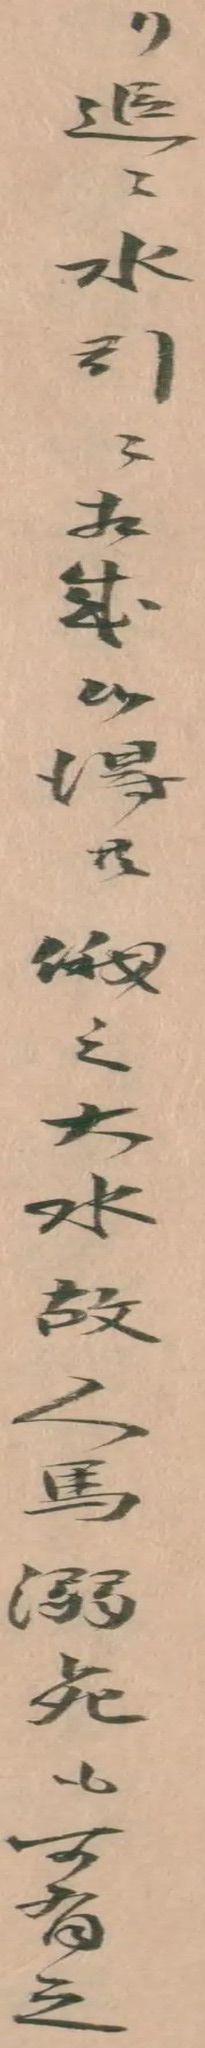り追々水引二相成候得共俄之大水故人馬溺死も可有之
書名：地災撮要. 巻3(地震之部)-巻4(噴火之部)
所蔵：国立国会図書館 National Diet Library, JAPAN
